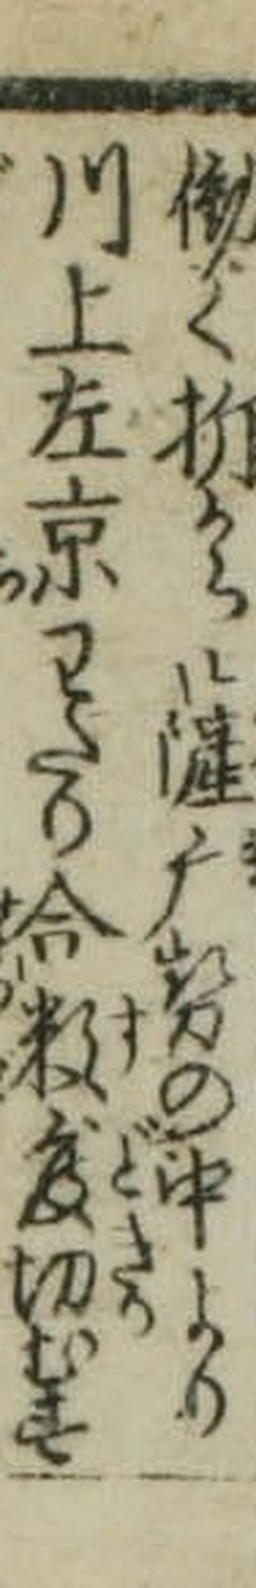川上左京わたり合数度切むす
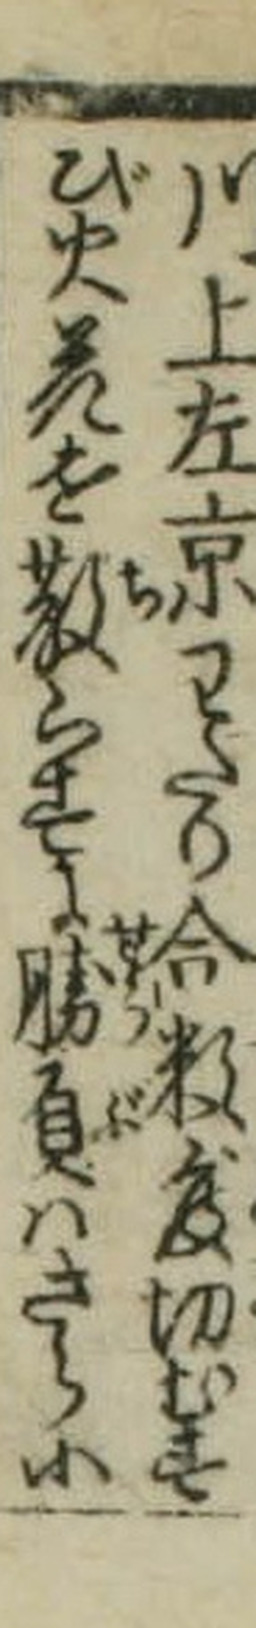び火花を散らすに勝負はさらに
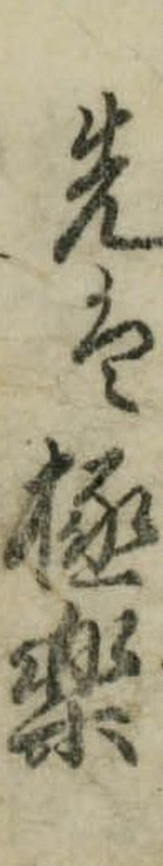先は極楽
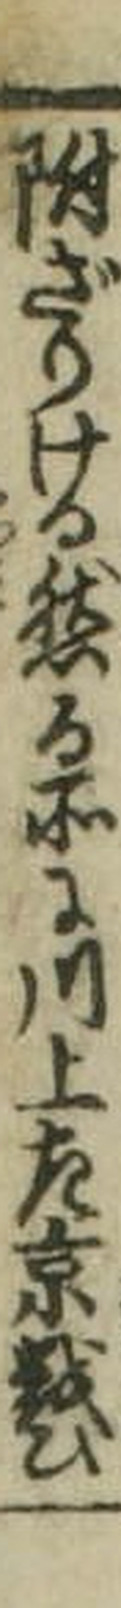附ざりける然る所に川上左京戦ひ
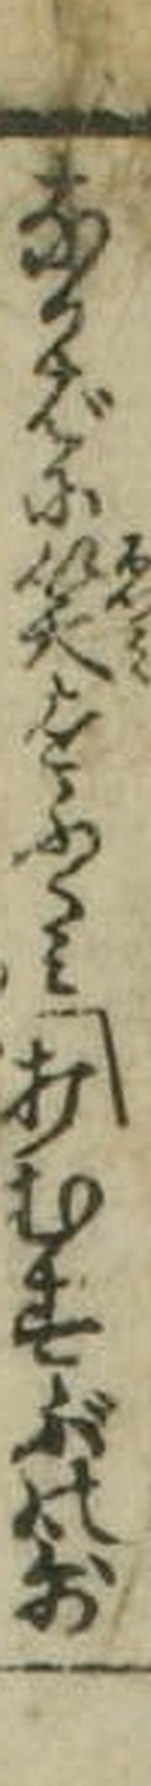なかばに笑をふくみ〽打むすぶの哥
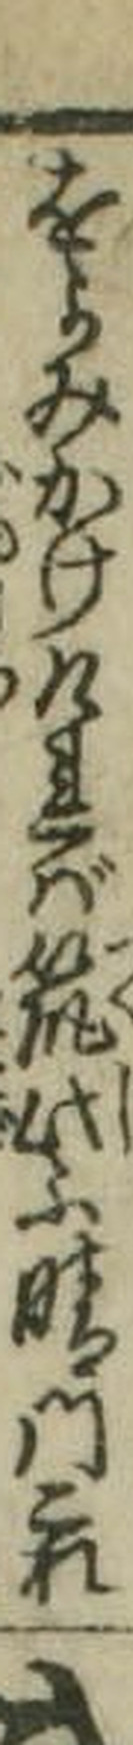をよみかけければ筑紫晴門これ
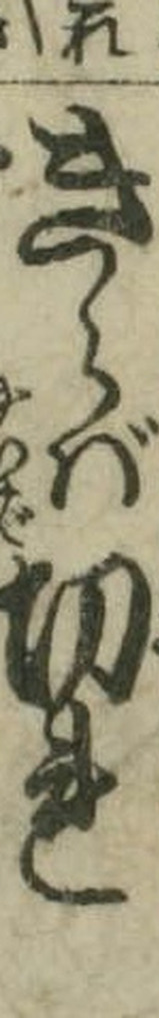きらば切れ
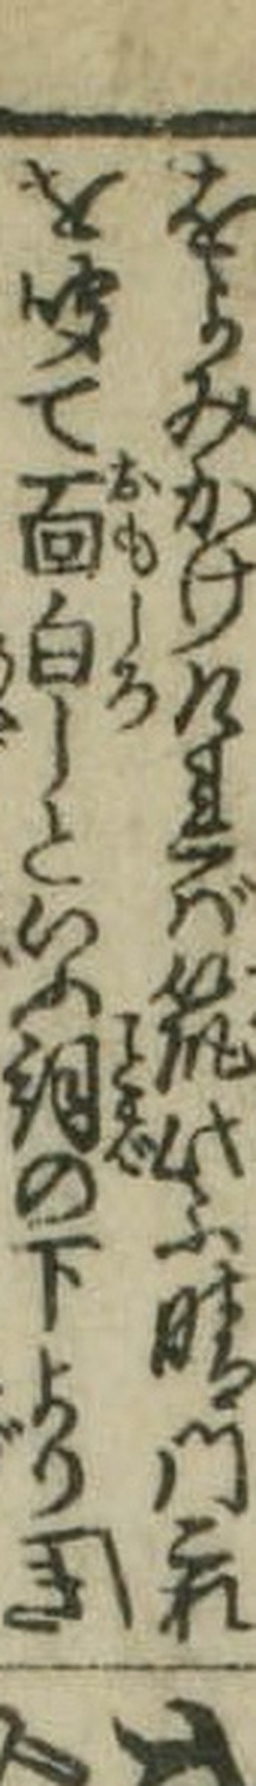を聞て面白しといふ詞の下より〽き
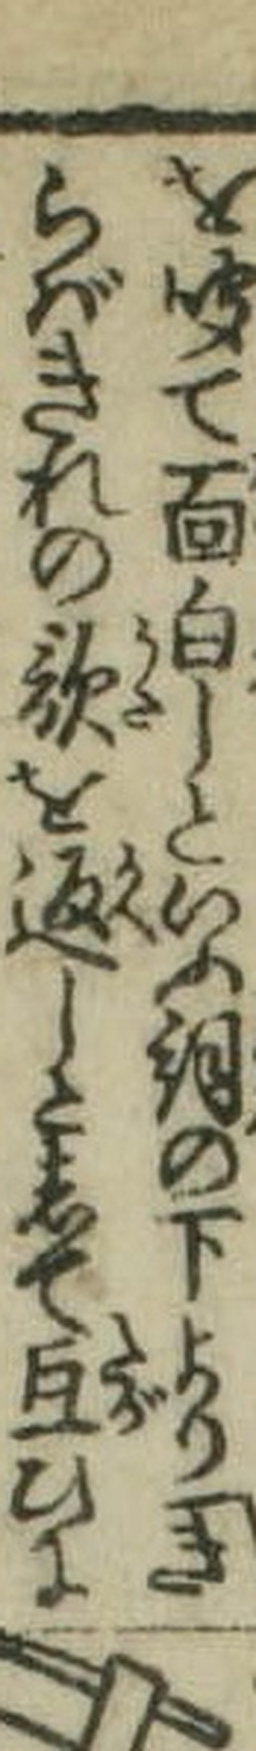らばきれの歌を返しとして互ひに
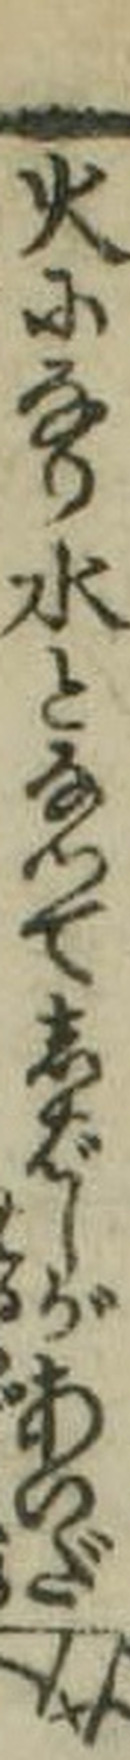火になり水となつてしばしがあいだ
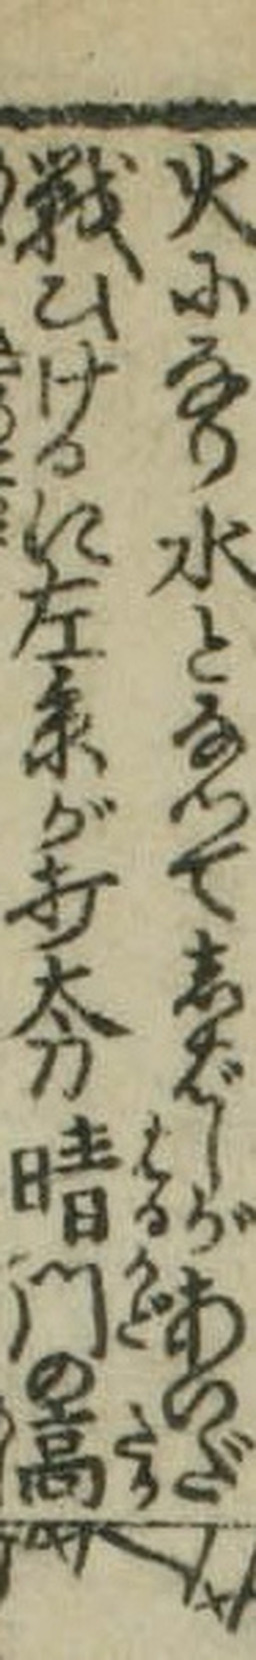戦ひけるに左京が打太刀晴門の高
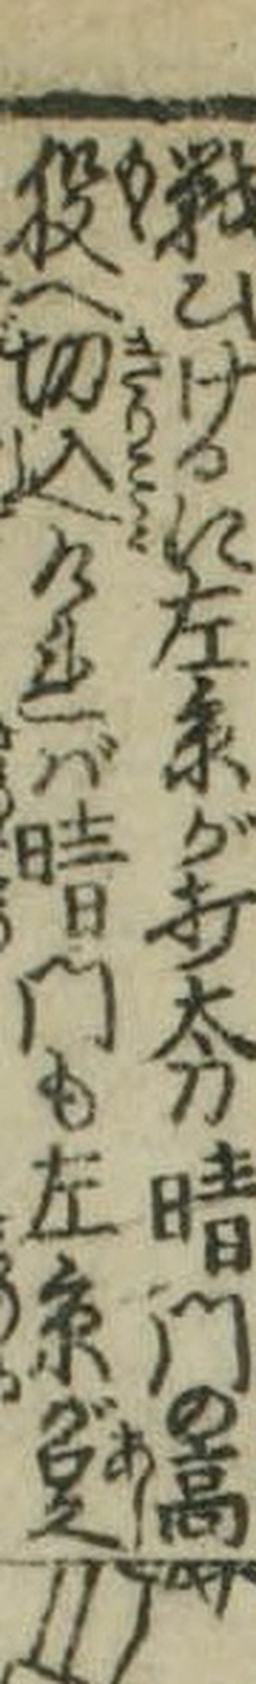股へ切込ければ晴門も左京が足
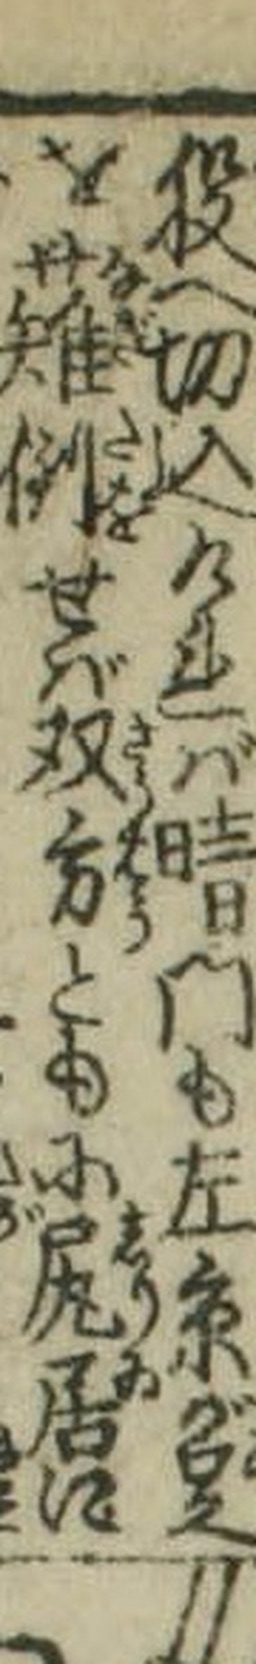を薙倒せば双方ともに尻居に
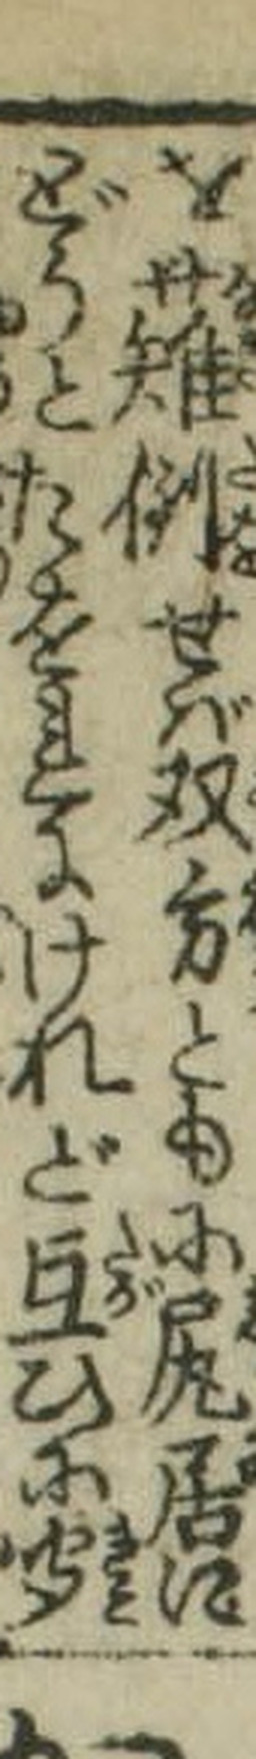どうとたをれにけれど互ひに聞
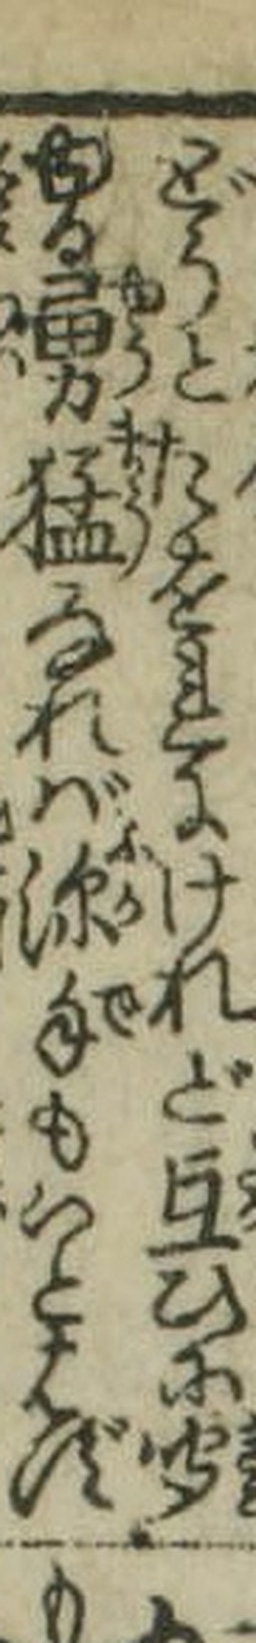ゆる勇猛なれば深手もいとはず
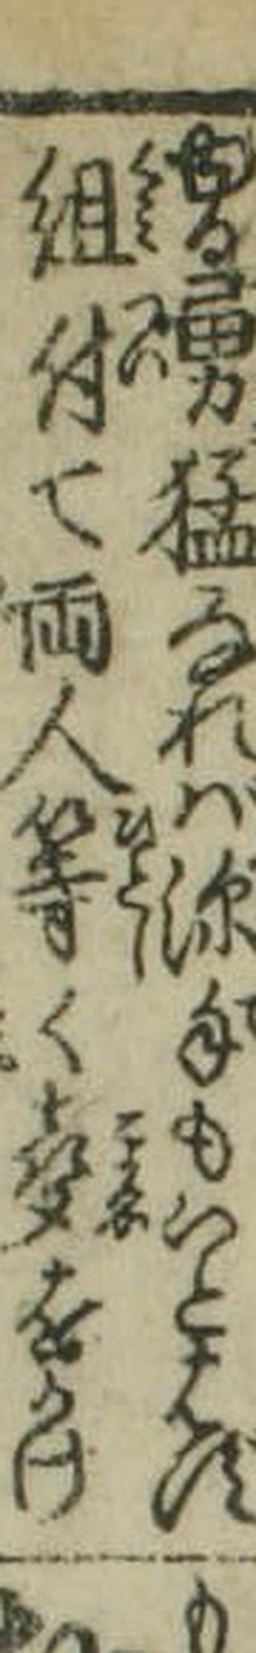組付て両人等く声をかけ
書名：續英雄百人一首
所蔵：東京学芸大学附属図書館
